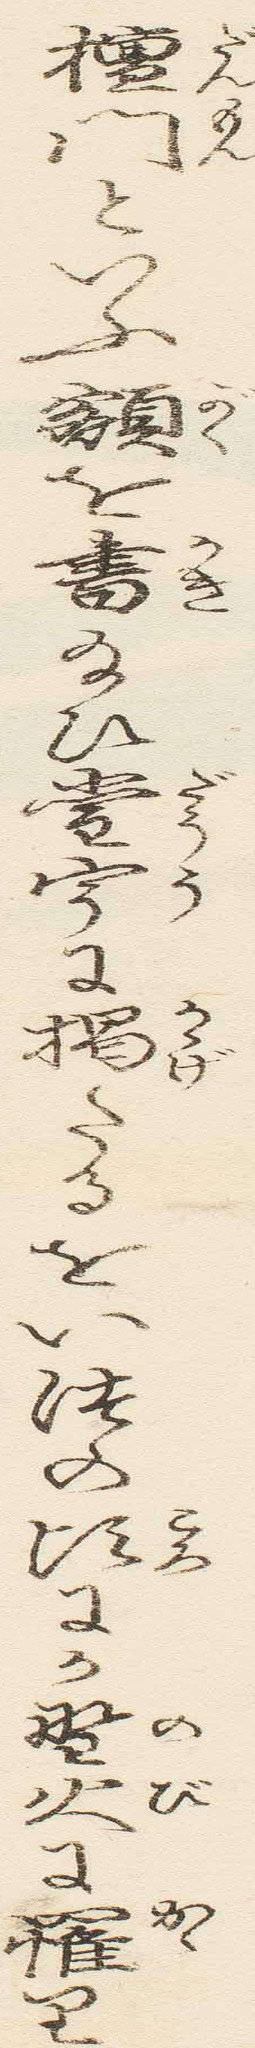檀門といふ額を書給ひ堂宇に掲たるをいつの頃にか㙒火に罹り
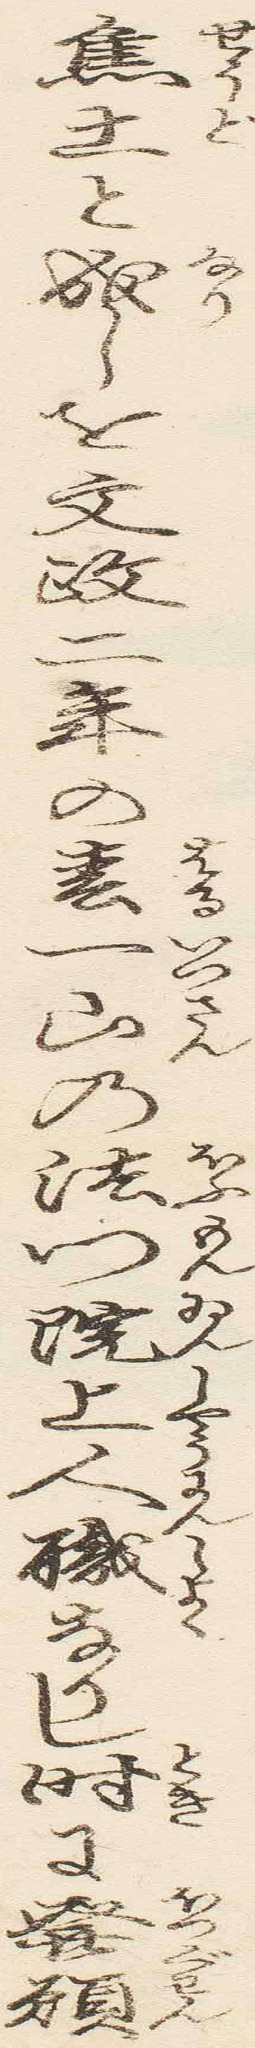焦土と成しを文政二年の春一山の法門院上人職なりし时に発願
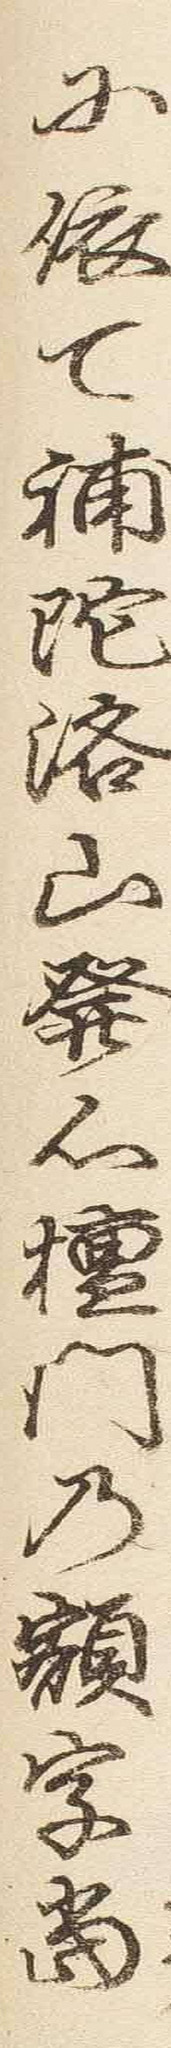に依て補陀洛山発心檀門の額字當
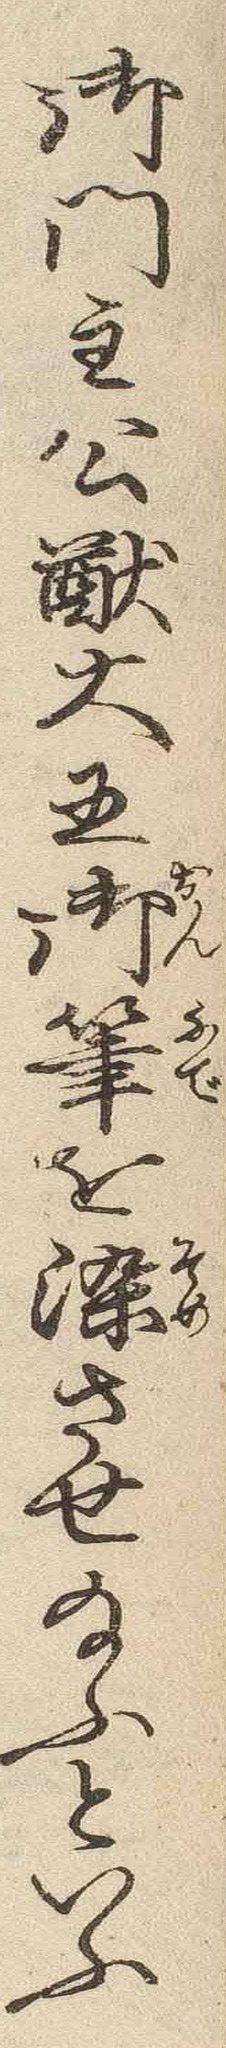御門主公猷大王御筆を染させ給ふといふ
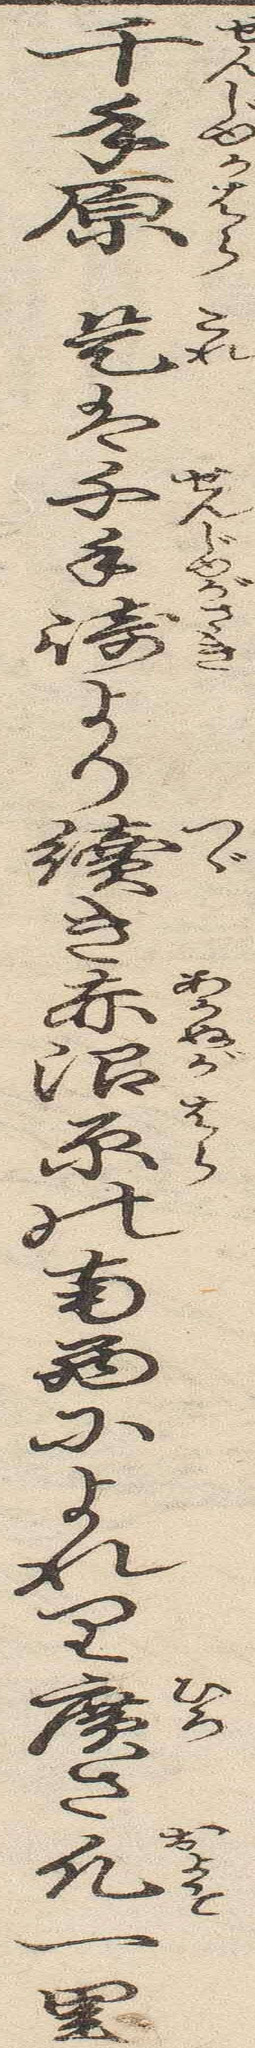千手原是は千手﨑より續き赤沼原の南西によれり廣さ凢一里
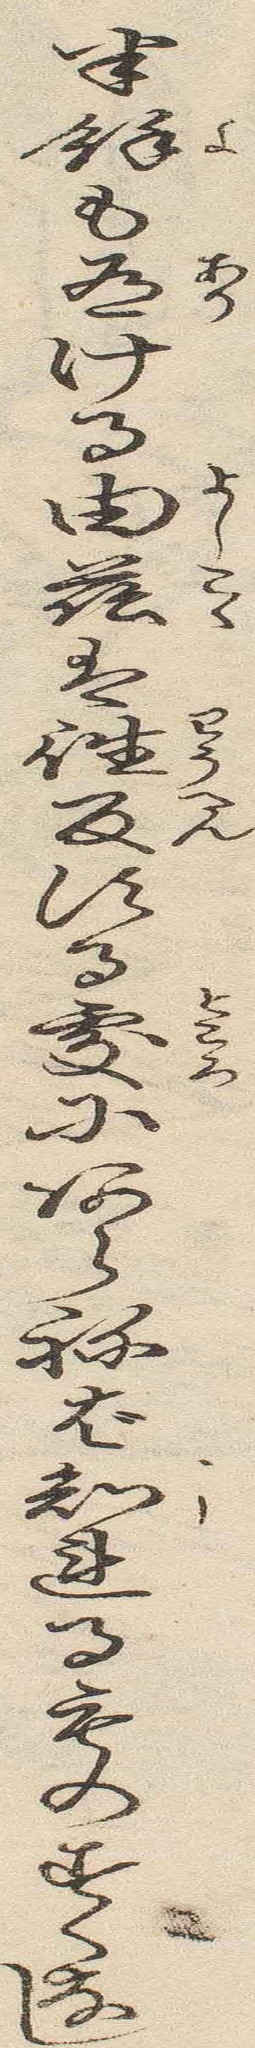半餘も有ける由兹は徃反する處にあらねば知れるものすくなし
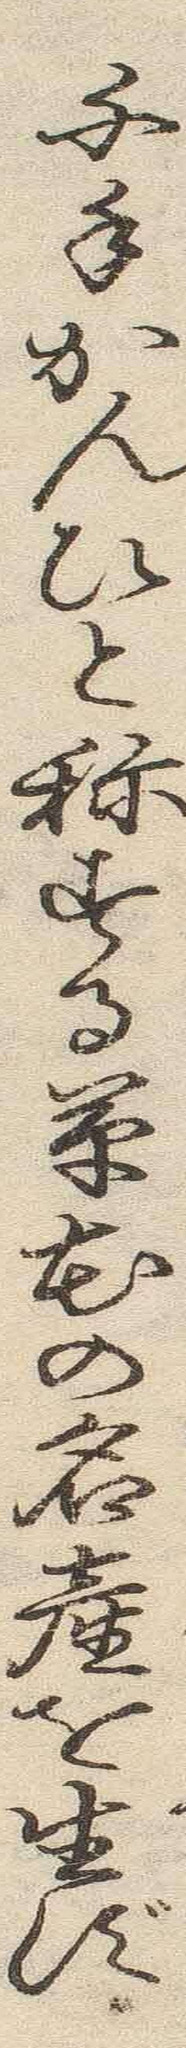千手かんひと称する草花の名産を生ず
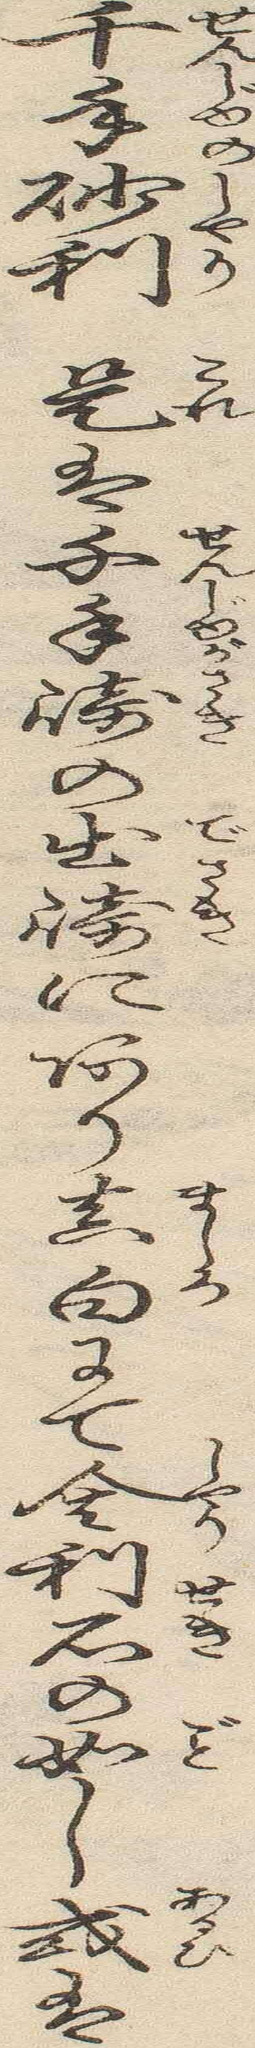千手砂利是は千手﨑の出﨑にあり真白にて舎利石の如し或は
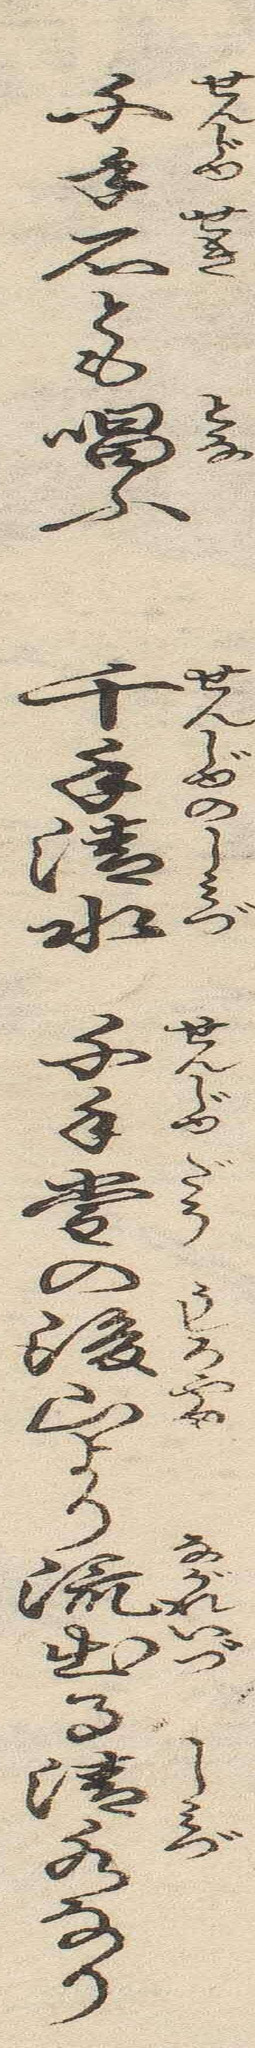千手石とも唱ふ千手清水千手堂の後山より流出る清水なり
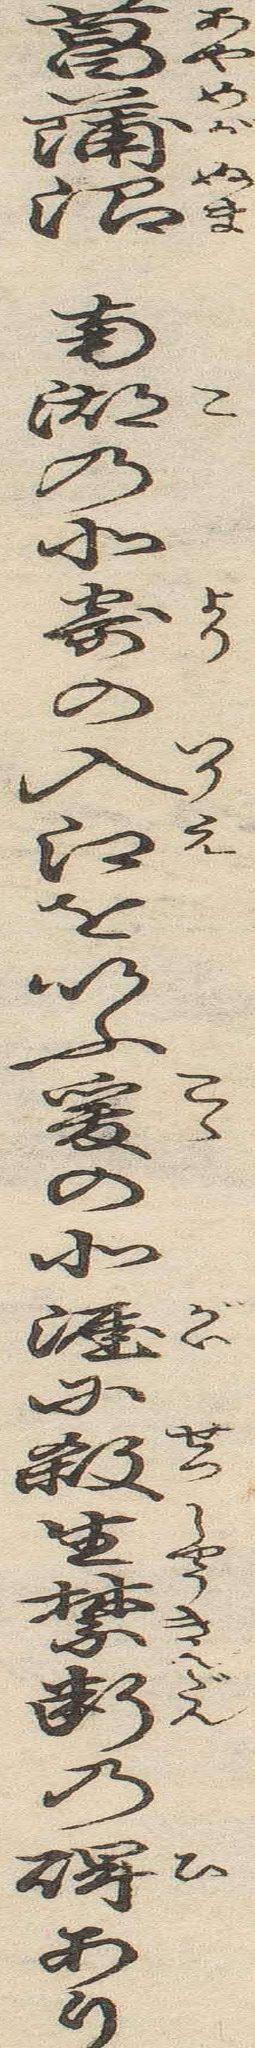菖蒲沼南湖の北寄の入江をいふ爰の北涯に殺生禁断の碑あり
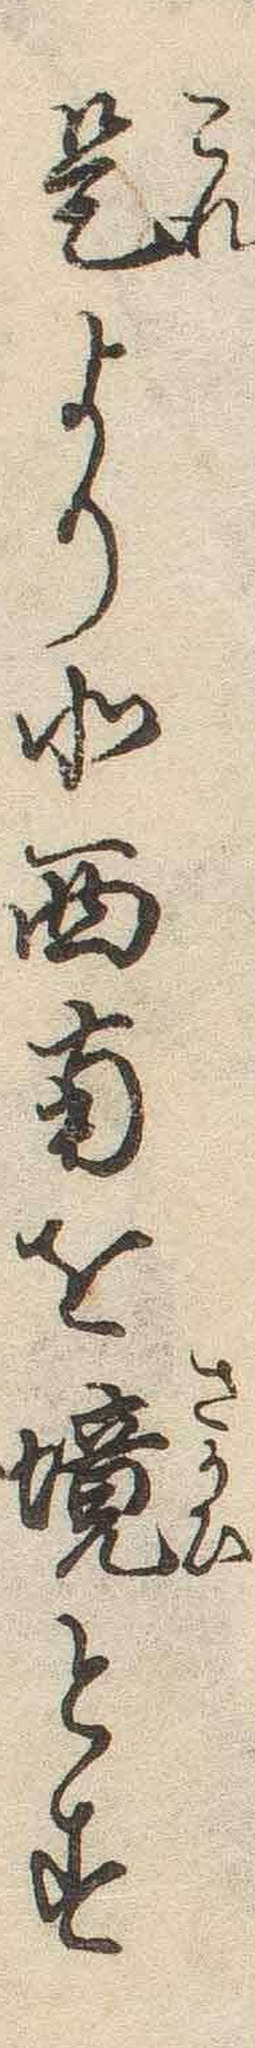是より北西南を境とす
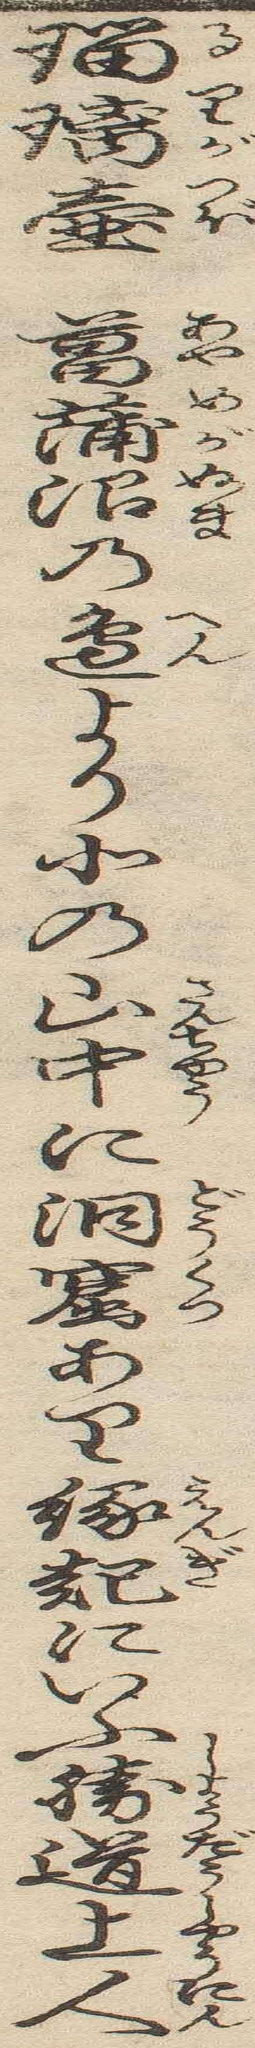瑠璃壷菖蒲沼の邊より北の山中に洞窟あり縁起にいふ勝道上人
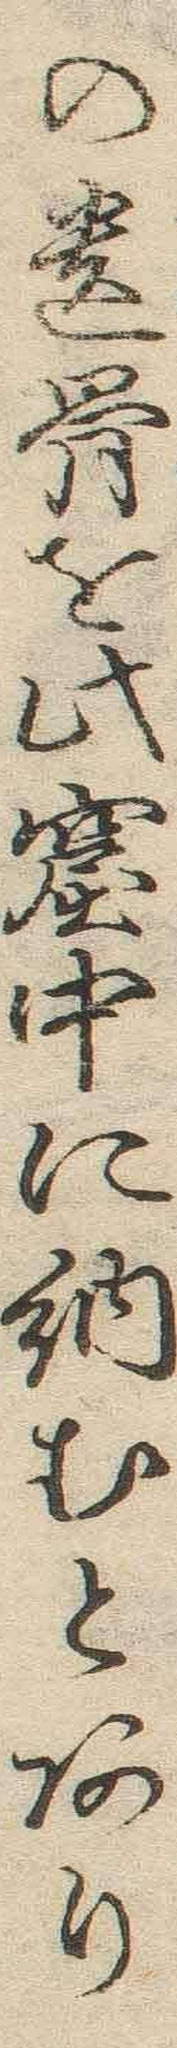の遺骨を此窟中に納むとあり
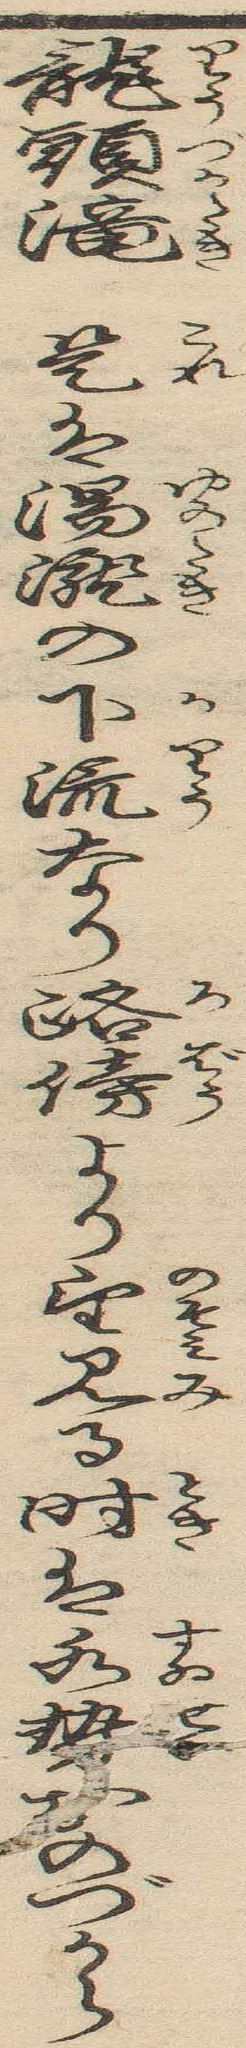龍頭滝是は湯瀧の下流なり路傍より望見る时は水㔟おのづから

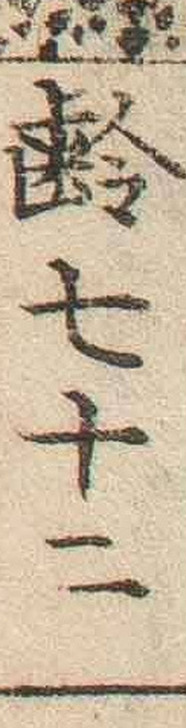齢七十二
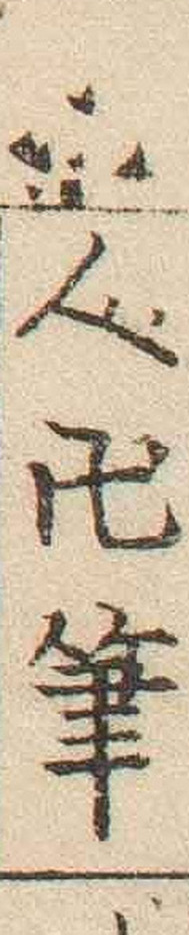人卍筆
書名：日光山志
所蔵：東京学芸大学附属図書館 国文学研究資料館
